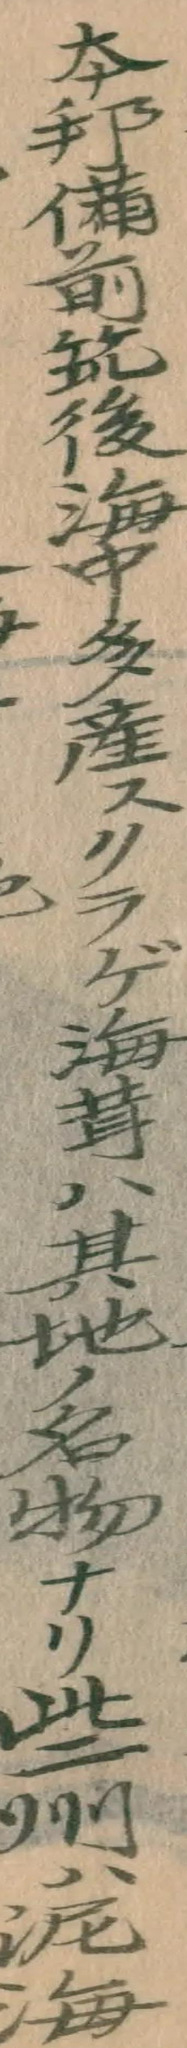本邦備前筑後海中多産スクラゲ海茸ハ其地ノ名物ナリ此二州ハ泥海
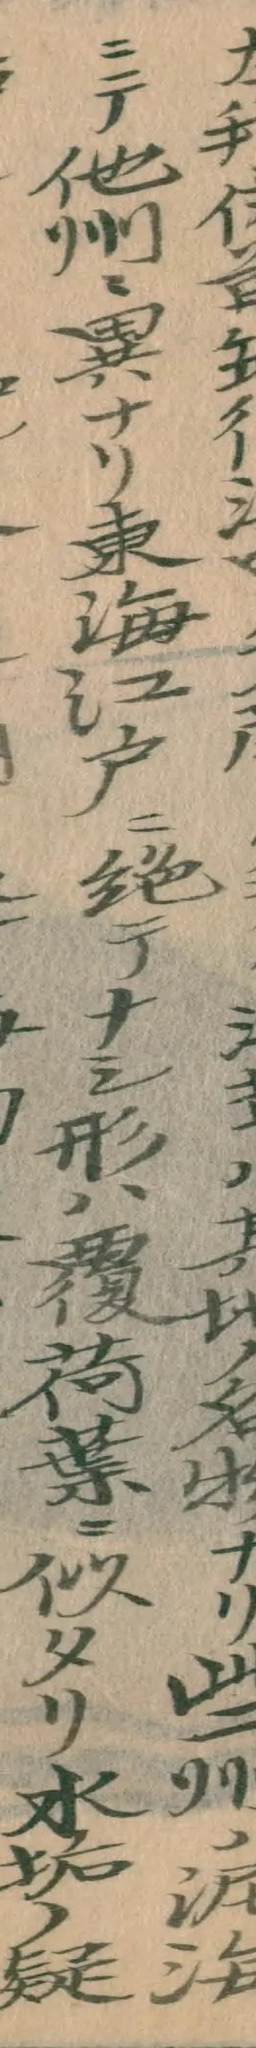ニテ他州ニ異ナリ東海江戸ニ絶テナシ形ハ覆荷葉ニ似タリ水垢ノ凝
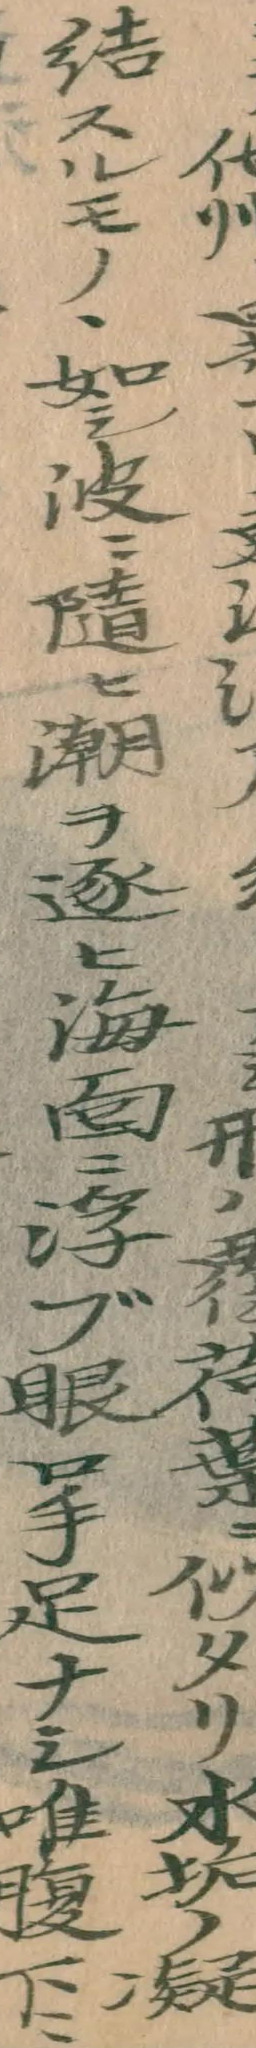結スルモノヽ如シ波ニ随ヒ潮ヲ逐ヒ海靣ニ浮ブ眼口手足ナシ唯腹下ニ
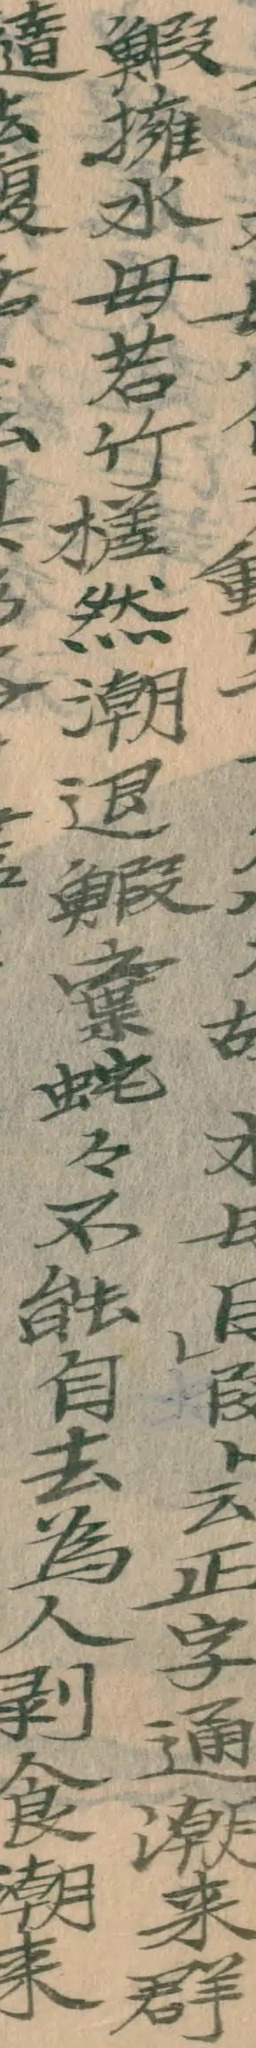鰕擁水母若竹槎然潮退鰕棄䖳々不能自去為人剥食潮来
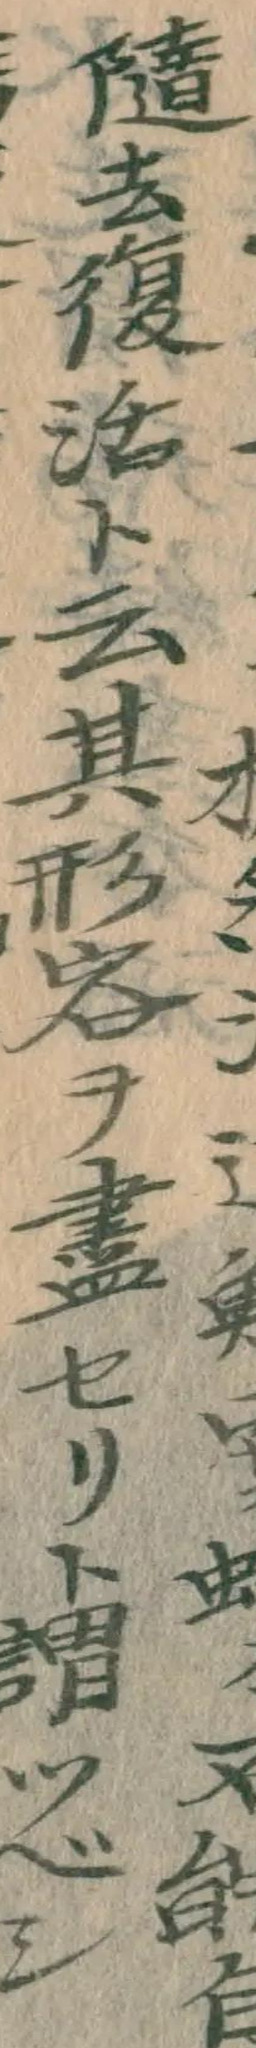随去復活ト云其形容ヲ盡セリト謂ツベシ
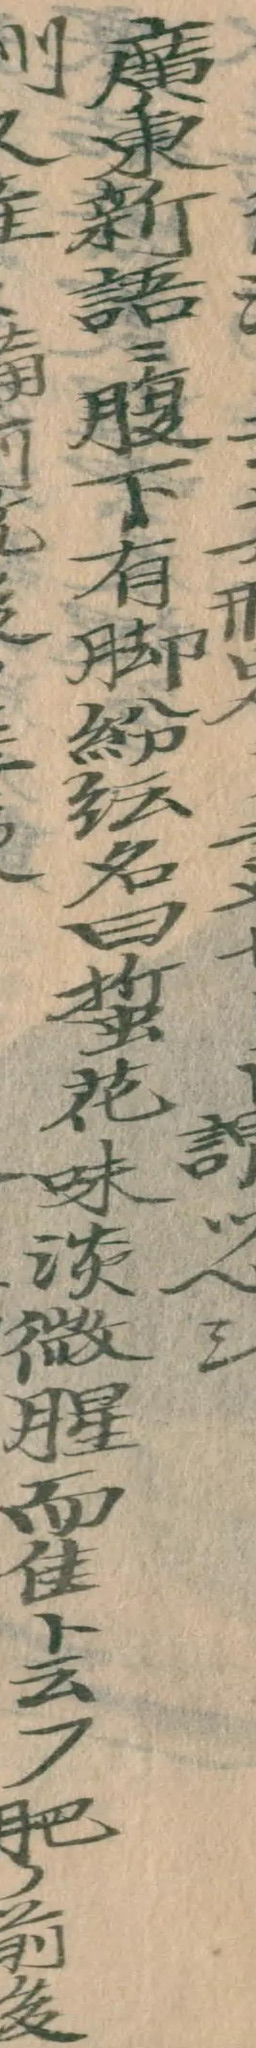廣東新語ニ腹下有脚紛紜名曰蜇花味淡微腥而隹ト云フ肥ノ前後
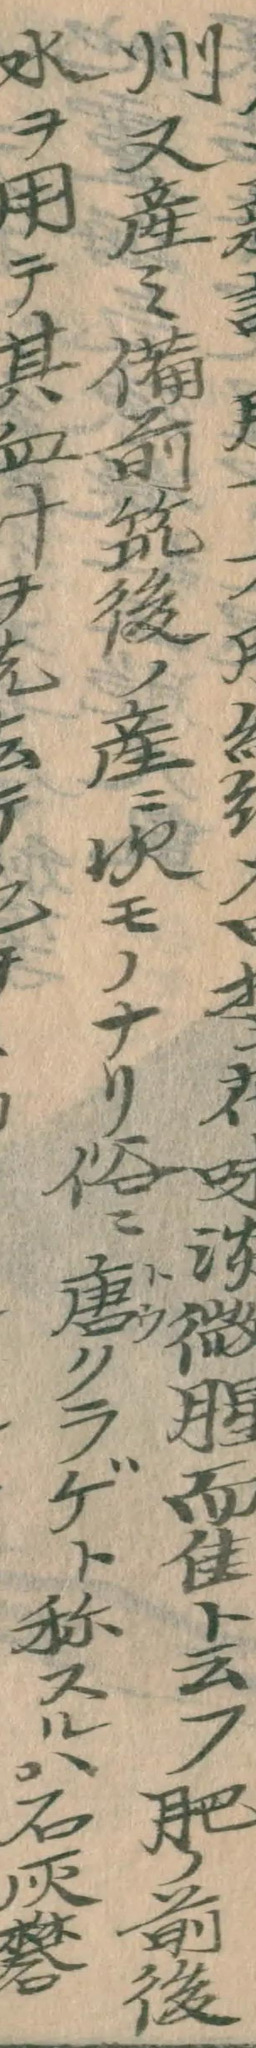州又産之備前筑後ノ産ニ次モノナリ俗ニ唐クラゲト称スルハ石灰礬
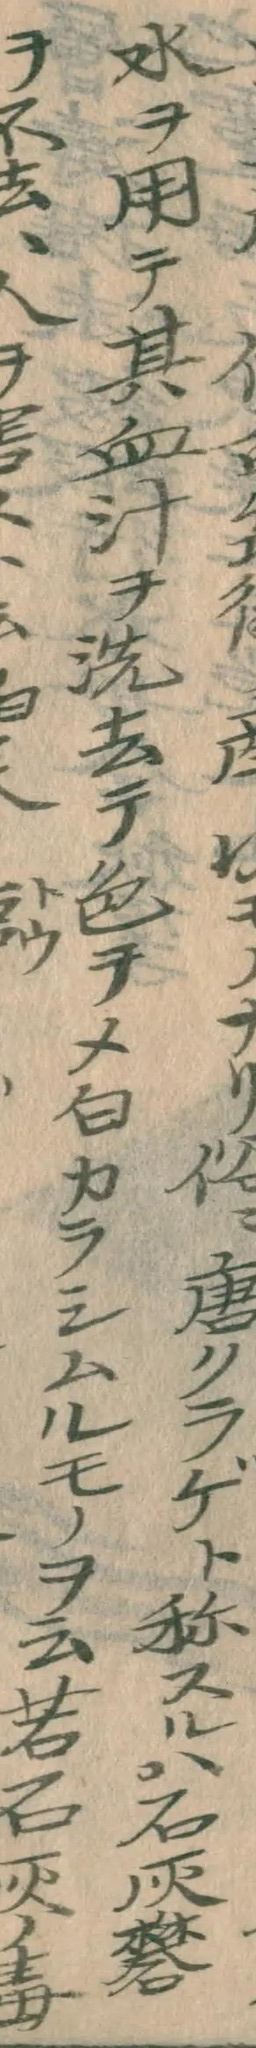水ヲ用テ其血汁ヲ洗去テ色ヲシテ白カラシムルモノヲ云若石灰ノ毒
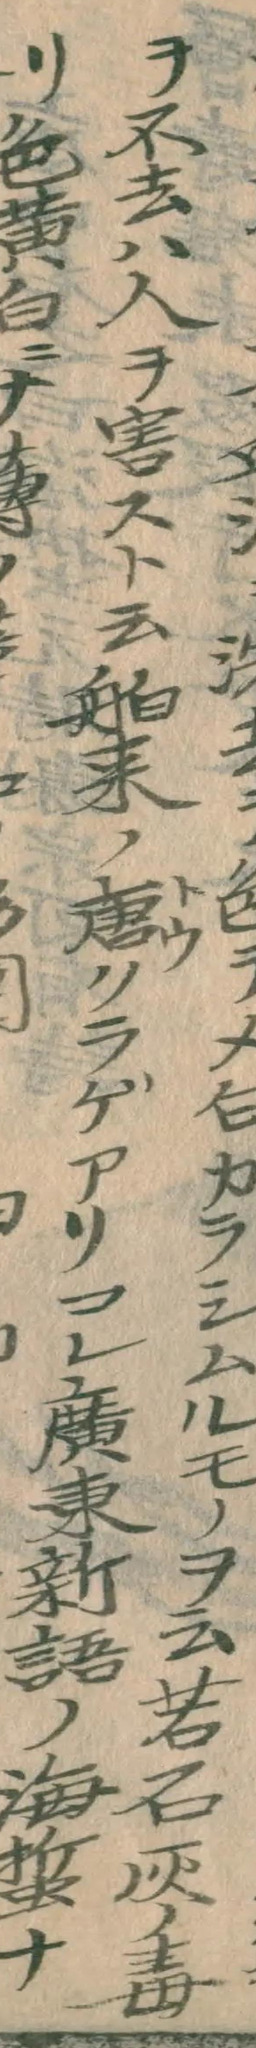ヲ不去ハ人ヲ害スト云舶来ノ唐クラゲアリコレ廣東新語ノ海蜇ナ
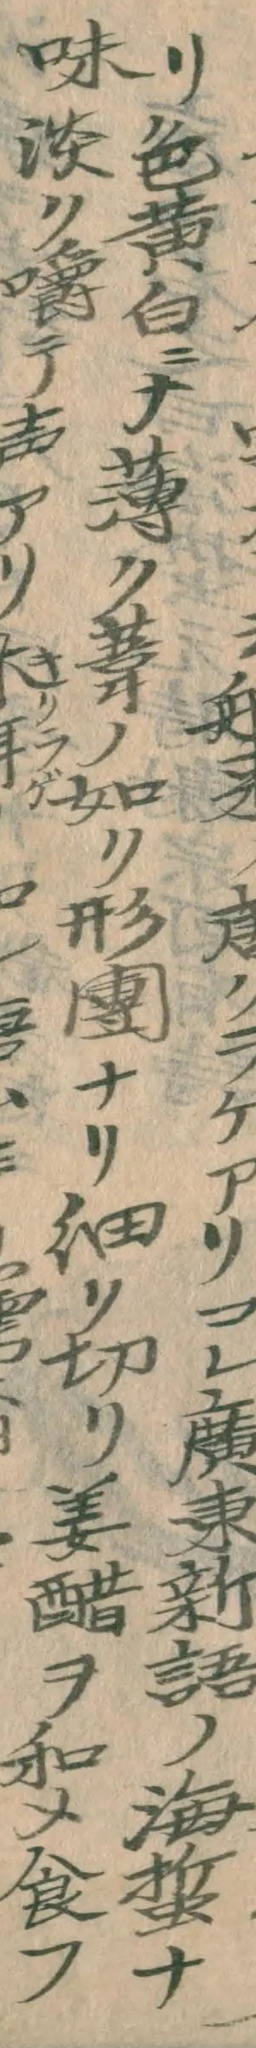リ色黄白ニシテ薄ク葦ノ如ク形團ナリ細ク切リ姜醋ヲ和シテ食フ
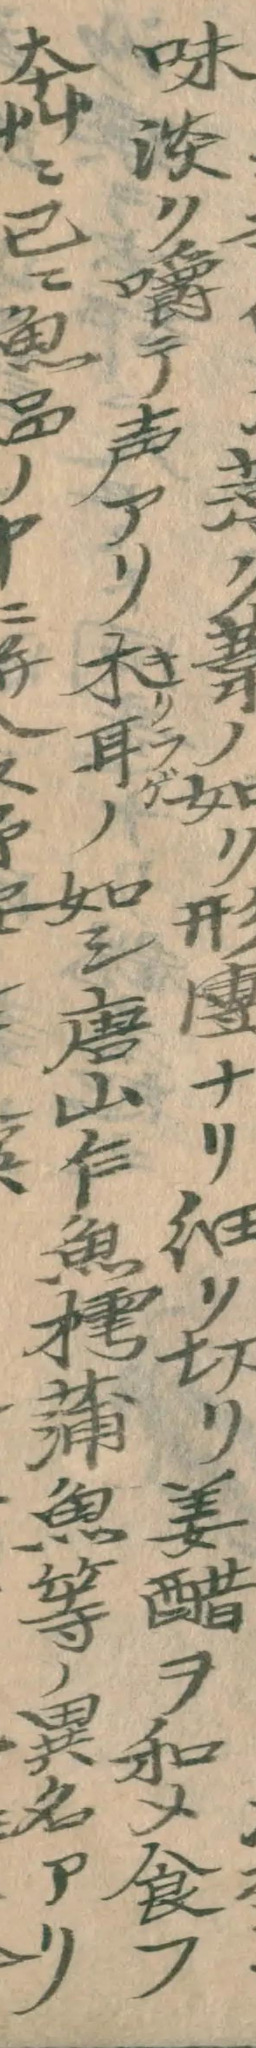味淡ク嚼テ声アリ木耳ノ如シ唐山乍魚樗蒲魚等ノ異名アリ
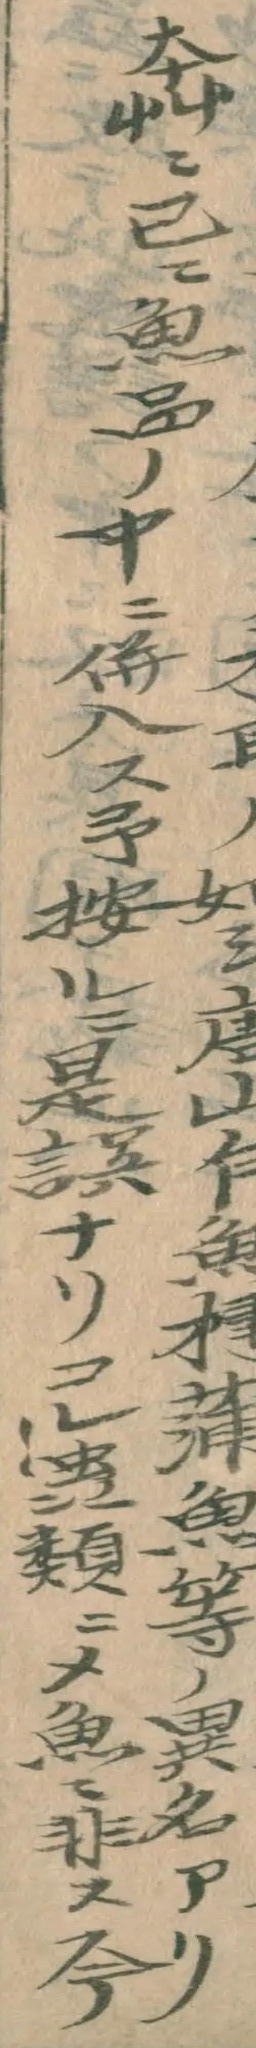本艸ニ已ニ魚品ノ中ニ併入ス予按ルニ是誤ナリコレ蟲類ニシテ魚ニ非ス今

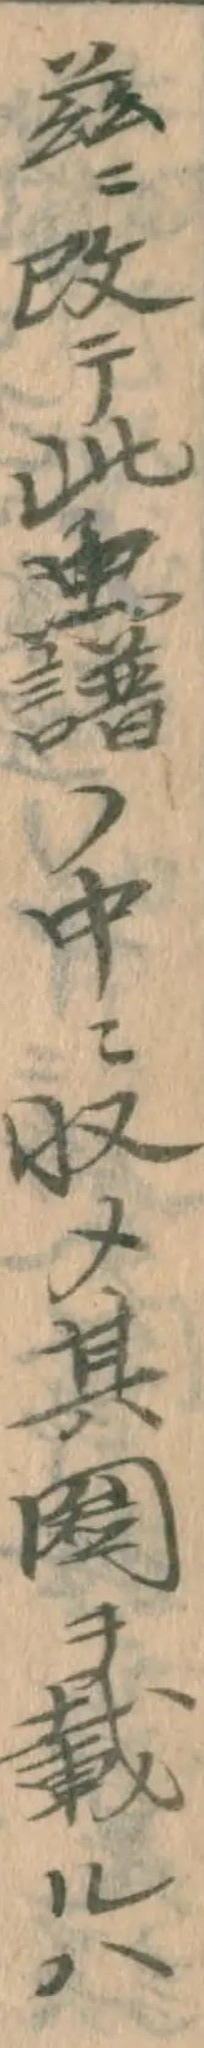茲ニ改テ此虫譜ノ中ニ収メ其圗ヲ載ルハ
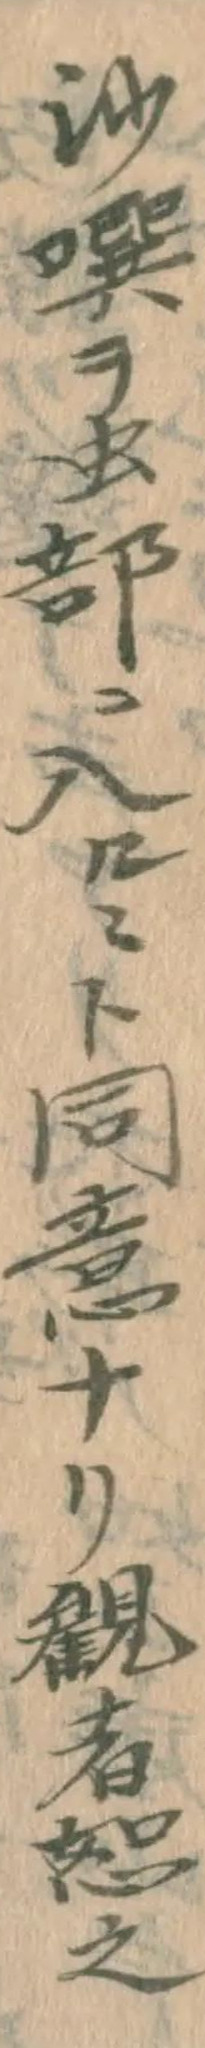沙噀ヲ虫部ニ入ルヽト同意ナリ観者恕之
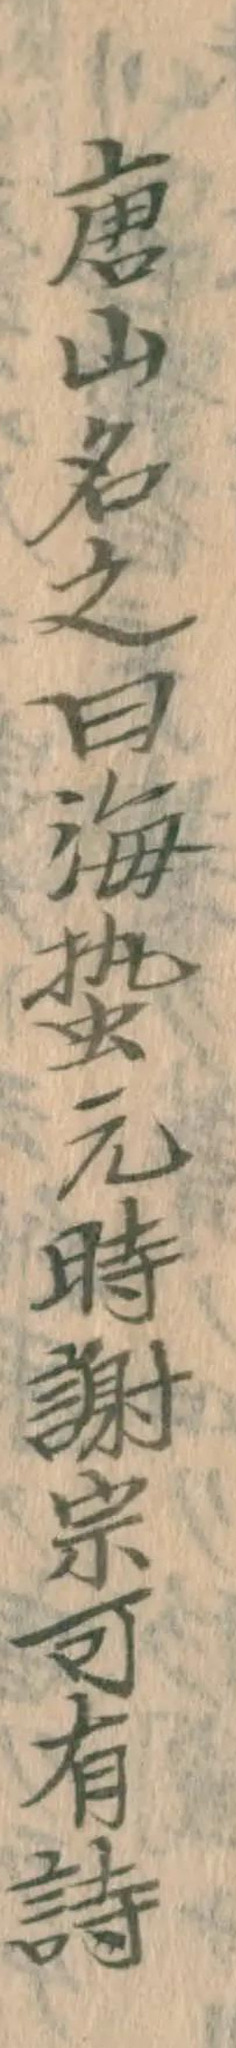唐山名之曰海蛰元時謝宗可有詩
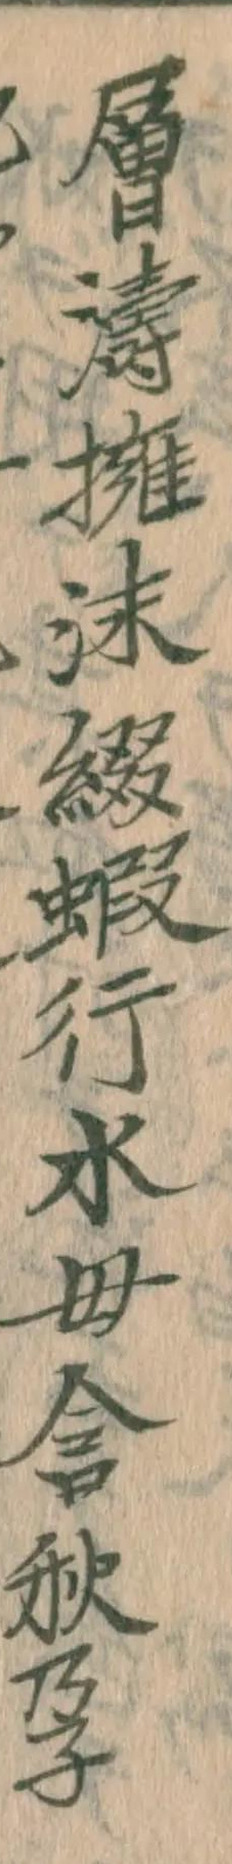層濤擁沫綴蝦行水母含秋孕
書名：千蟲譜 3巻. [1]
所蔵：国立国会図書館 National Diet Library, JAPAN
